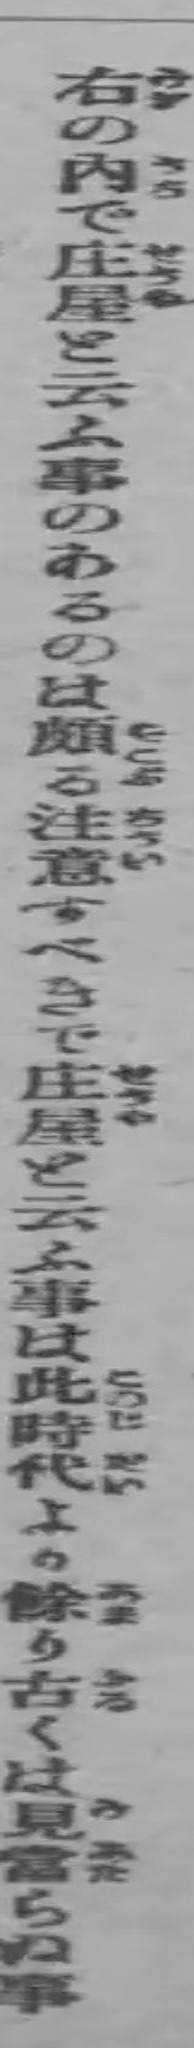右の内で庄屋と云ふ事のあるのは頗る注意すべきで庄屋と云ふ事は此時代より余り古くは見当らぬ事
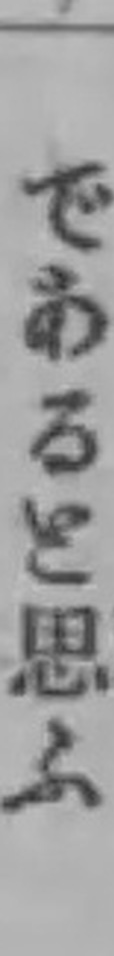であると思ふ
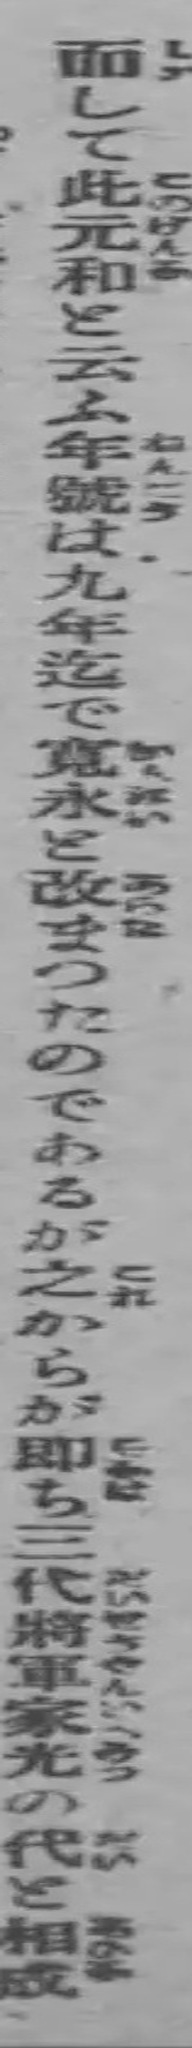寛永と改元而して此元和と云ふ年号は九年迄で寛永と改まつたのであるが之からが即ち三代将軍家光の代と相成
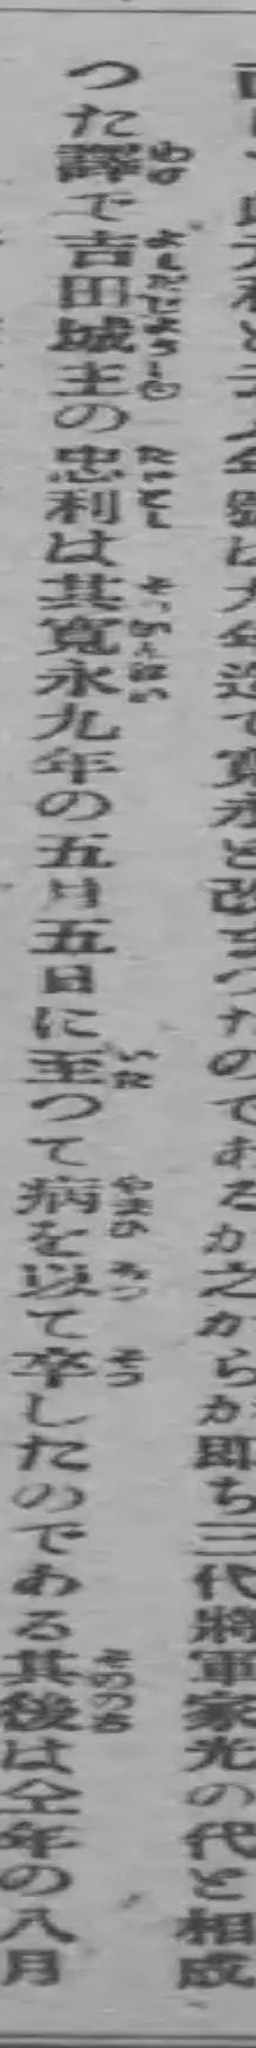利忠卒すつた訳で吉田城主の忠利は其寛永九年の五月五日に至つて病を以て卒したのである其後は仝年の八月
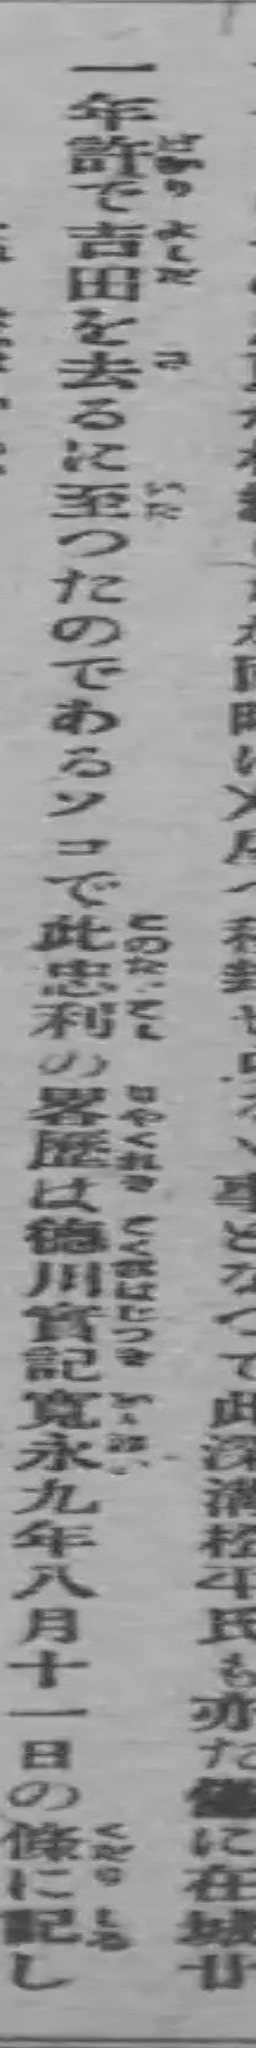一年許で吉田を去るに至つたのであるソコで此忠利の略歴は徳川実記寛永九年八月十一日の条に記し
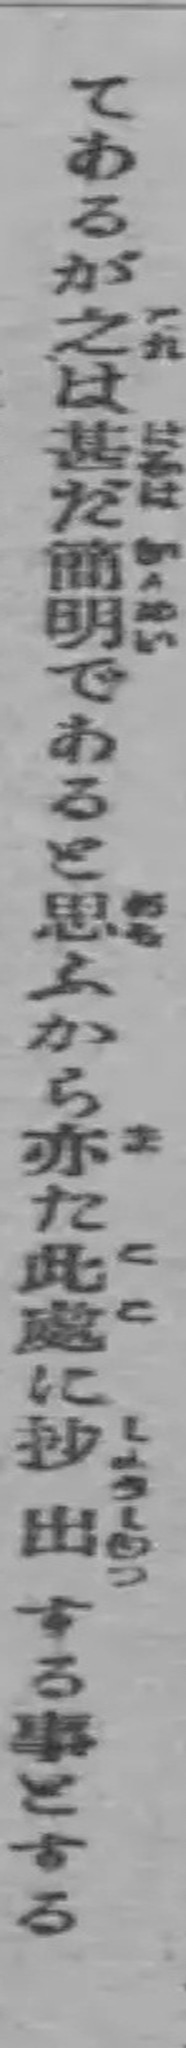てあるが之は甚だ簡明であると思ふから亦た此処に抄出する事とする
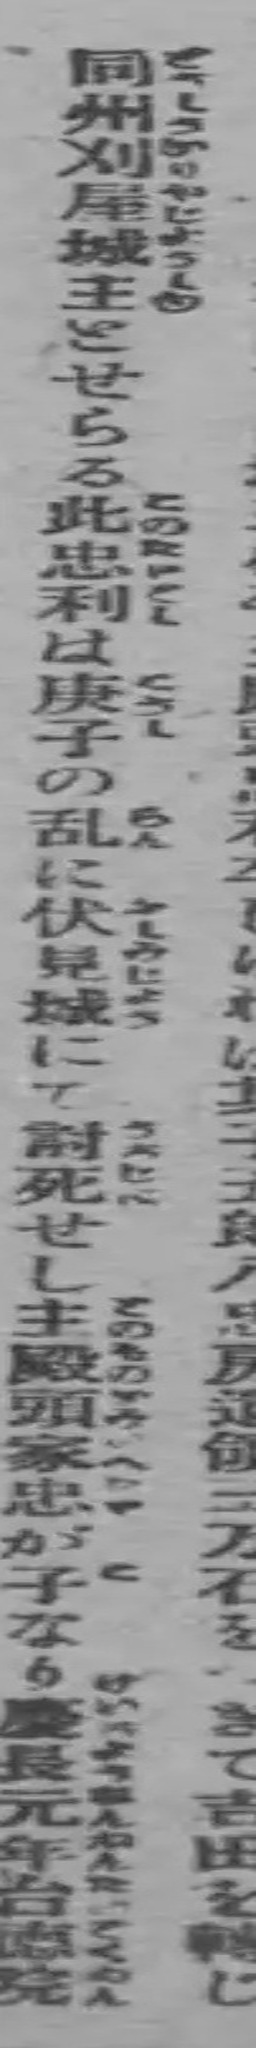同州刈屋城主とせらる此忠利は庚子の乱に伏見城にて討死せし主殿頭家忠が子なり慶長元年台徳院
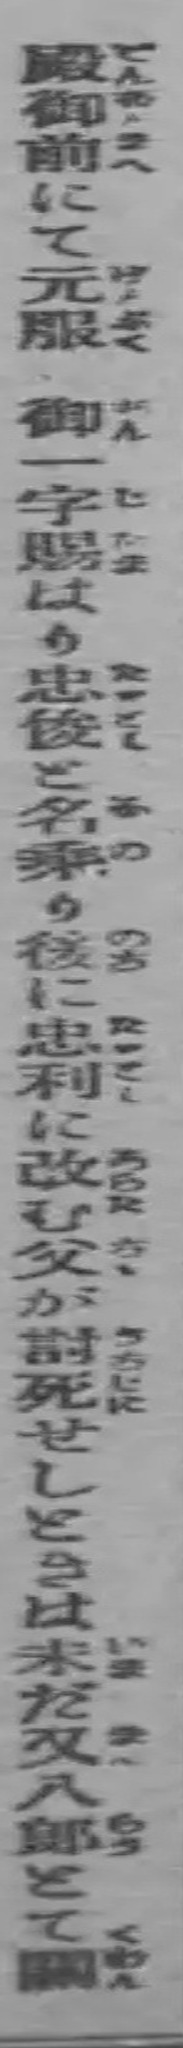殿御前にて元服し御一字賜はり忠俊と名乗り後に忠利に改む父が討死せしときは未だ又八郎とて関
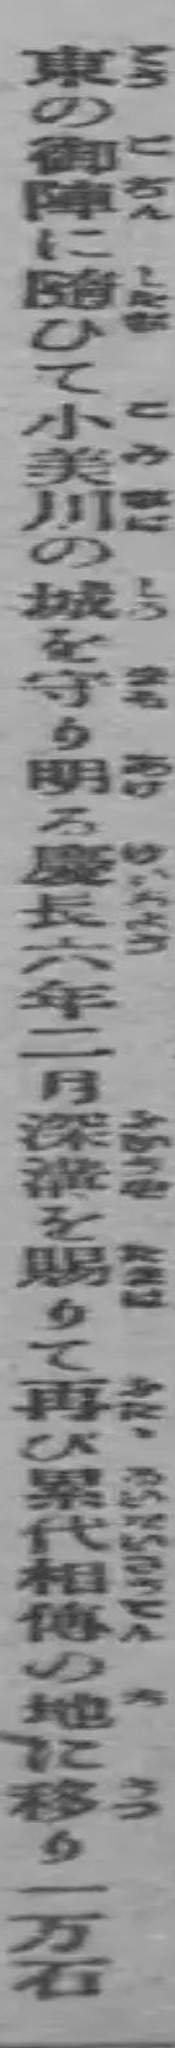東の御陣に随ひて小美川の城を守り明る慶長六年二月深溝を賜りて再び累代相伝の地に移り一万石
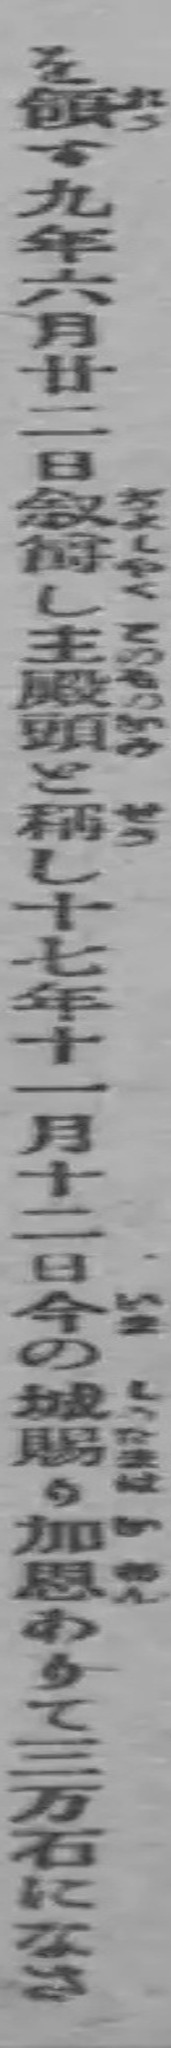を領す九年六月廿二日叙爵し主殿頭と称し十七年十一月十二日今の城賜り加恩ありて三万石になさ
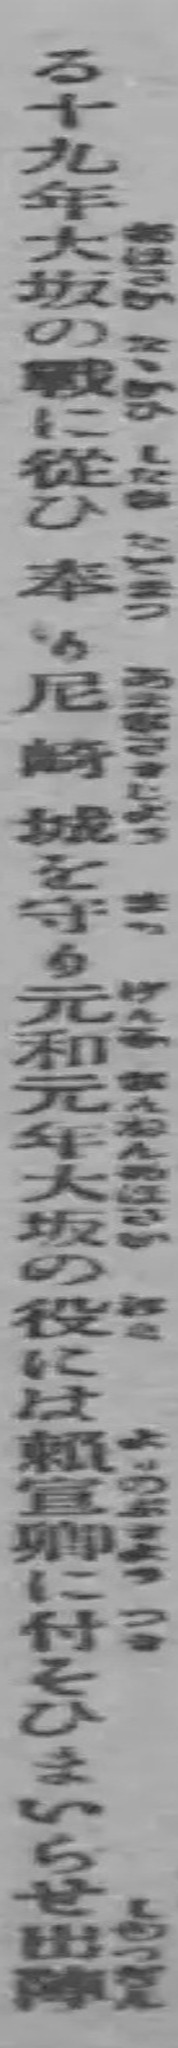る十九年大坂の戦に従ひ奉り尼崎城を守り元和元年大坂の役には頼宣卿に付そひまいらせ出陣
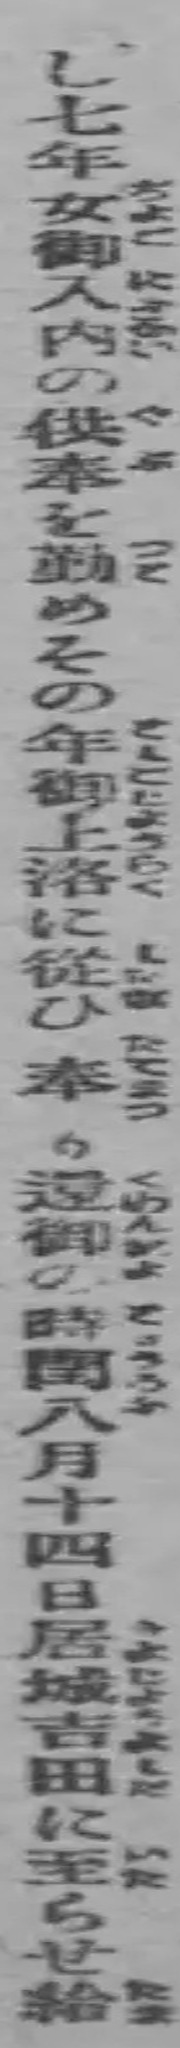し七年女御入内の供奉を勤めその年御上洛に従ひ奉り還御の時閏八月十四日居城吉田に至らせ給
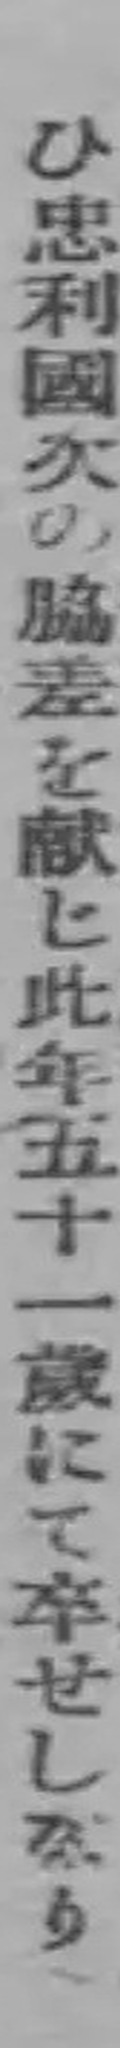ひ忠利国次の脇差を献じ此年五十一歳にて卒せしなり
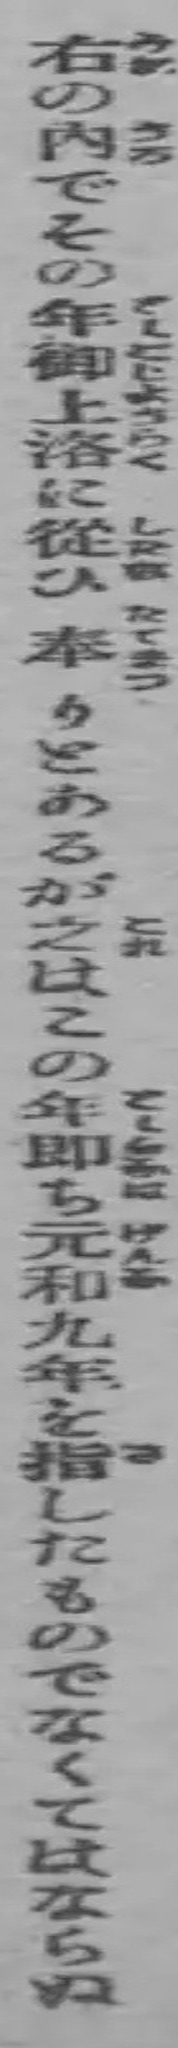右の内でその年御上洛に従ひ奉りとあるが之はこの年即ち元和九年を指したものでなくてはならぬ
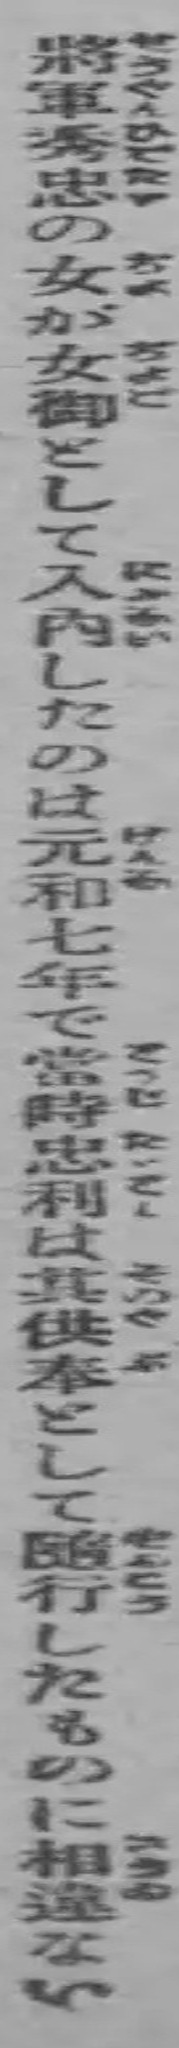将軍秀忠の女が女御として入内したのは元和七年で当時忠利は其供奉として随行したものに相違ない
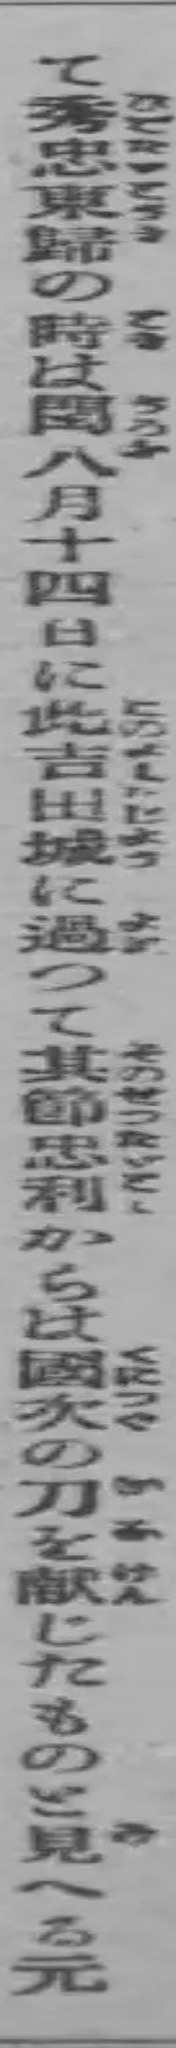て秀忠東帰の時は閏八月十四日に此吉田城に過つて其節忠利からは国次の刀を献じたものと見へる元
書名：豊橋市史談
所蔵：国立国会図書館 National Diet Library, JAPAN
